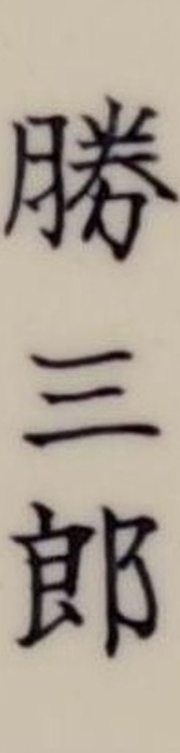勝三郎
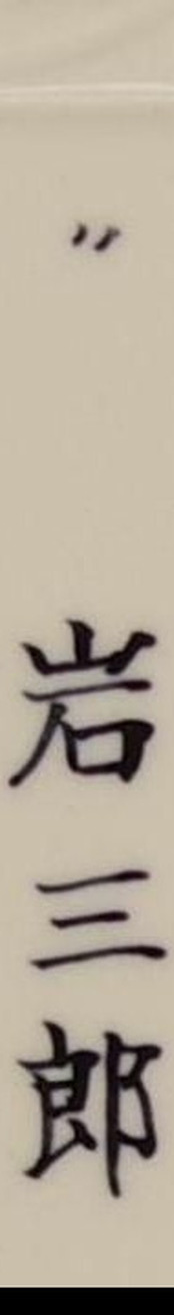岩三郎
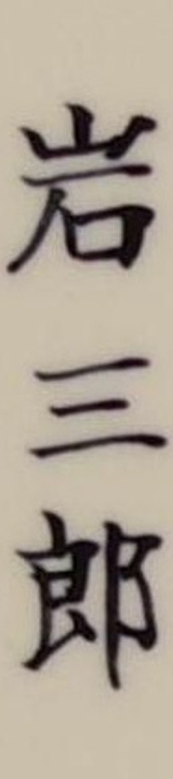岩三郎
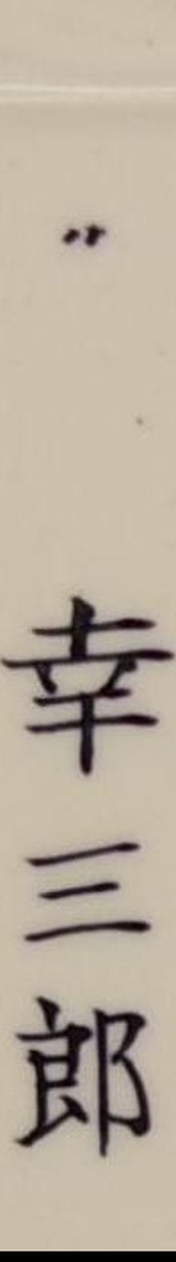幸三郎
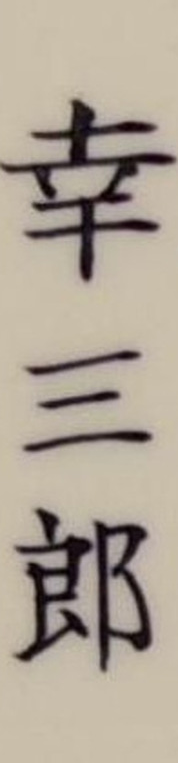幸三郎
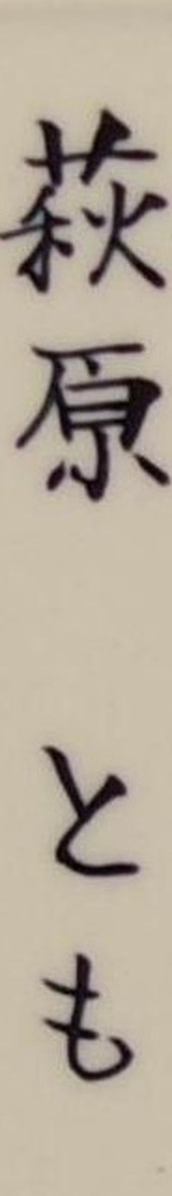萩原とも
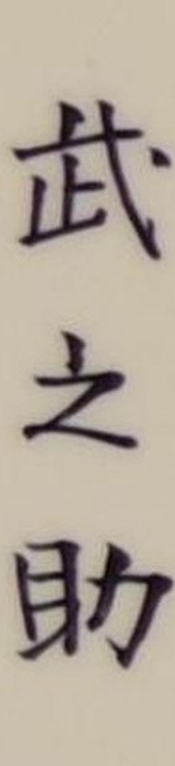武之助
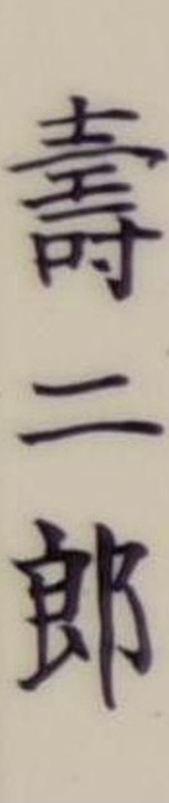壽二郎

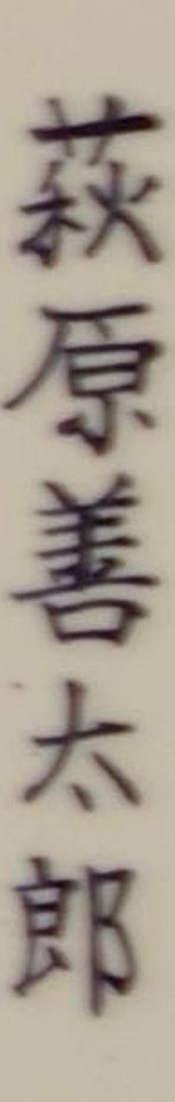萩原善太郎
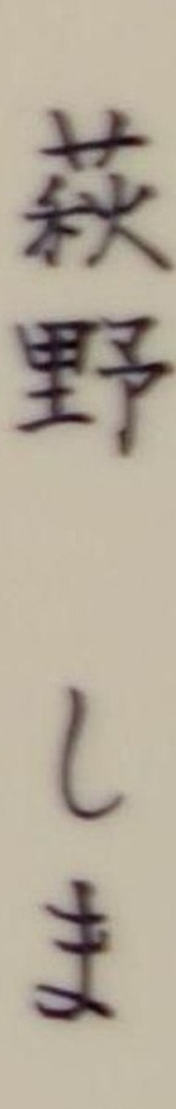萩野しま
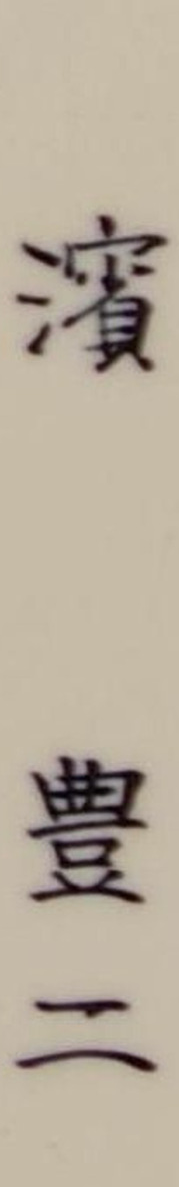濱豊二
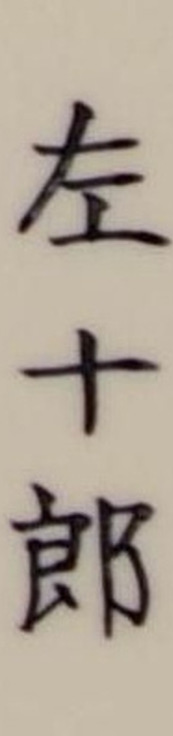左十郎
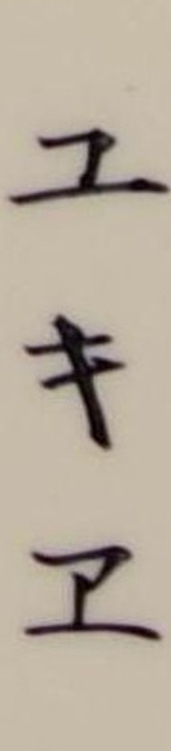ユキエ
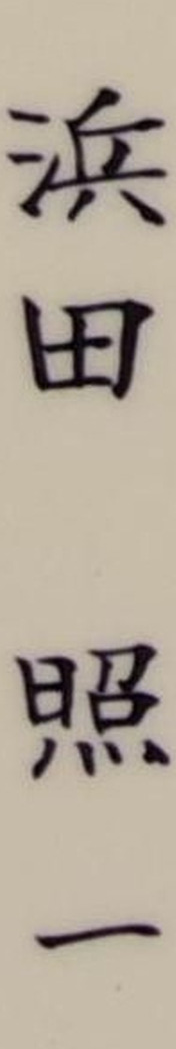浜田照一
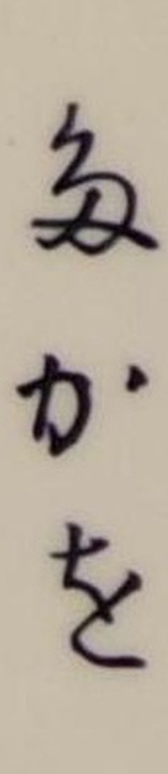たかを

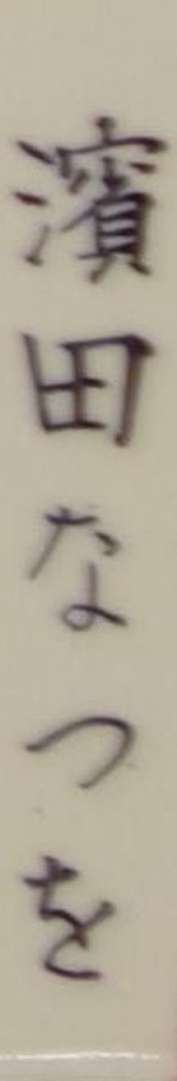濱田なつを
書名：M~S
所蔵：高野山金剛峯寺
